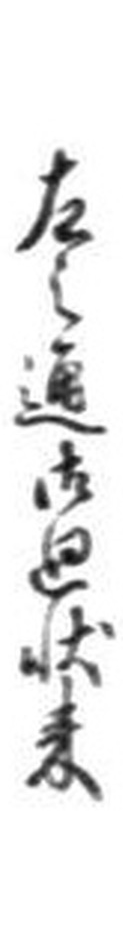左之通御廻状来
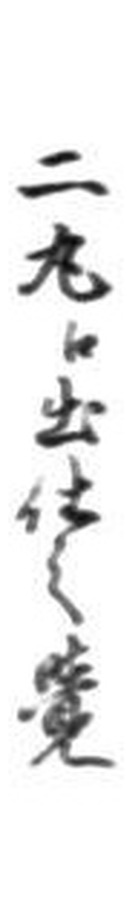二丸江出仕之覚
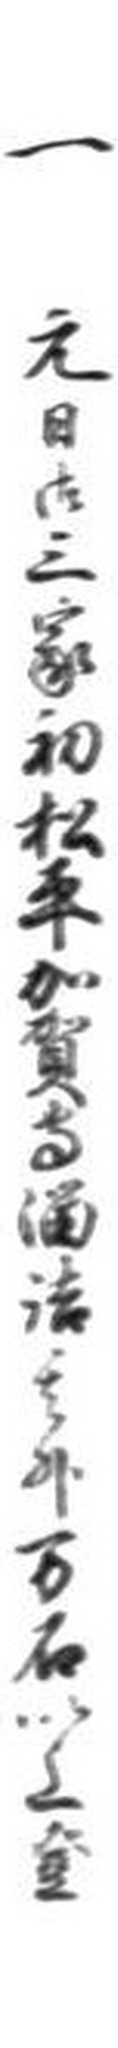一元日御三家初松平加賀守溜詰其外万石以上登
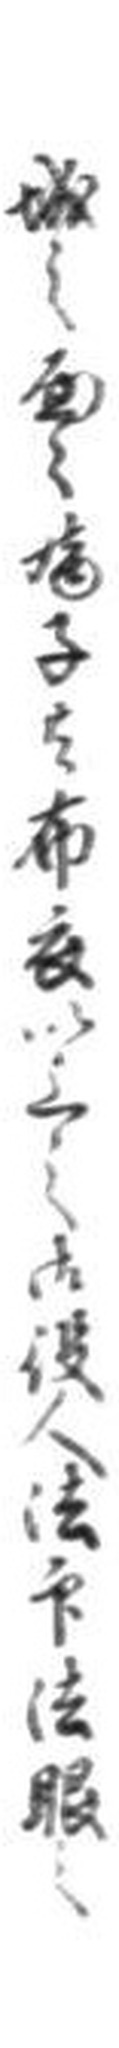城之面々嫡子共布衣以上之御役人法印法眼之
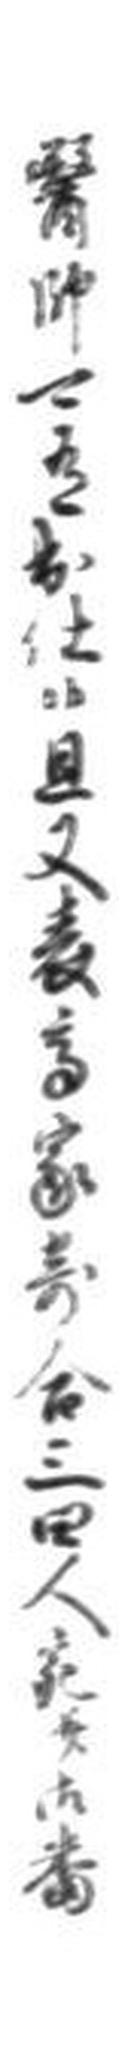医師可有出仕且又表高家寄合三四人宛并御番
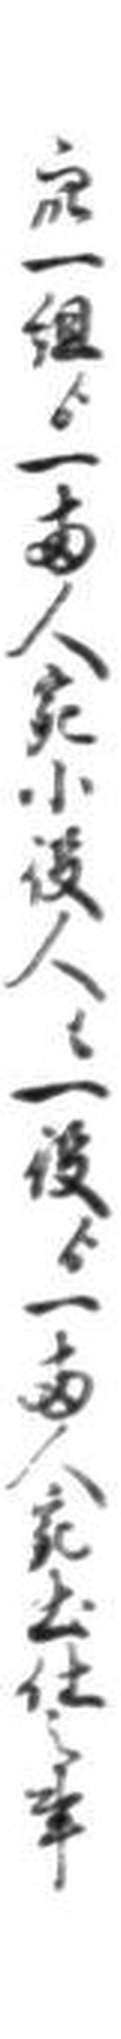衆一組ゟ一両人宛小役人も一役ゟ一両人宛出仕之事

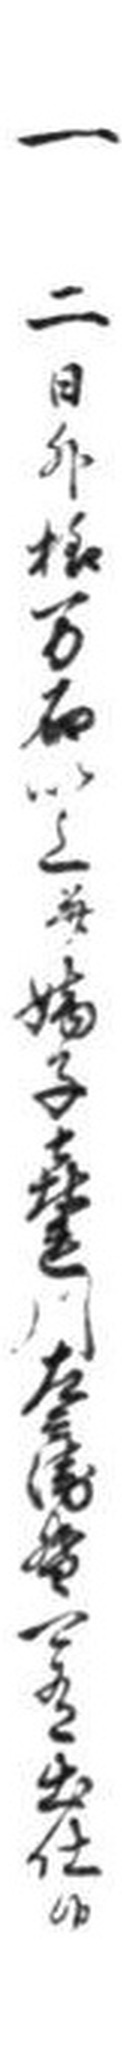一二日外様万石以上并嫡子喜連川左兵衛督可有出仕候
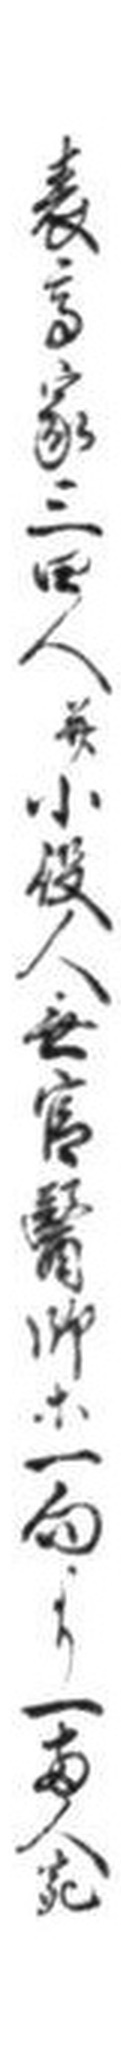表高家三四人并小役人無官医師等一向より一両人宛
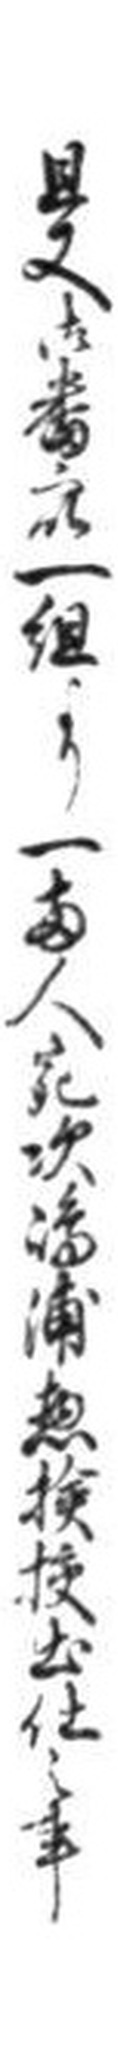且又御番衆一組より一両人宛次嶋浦惣検校出仕之事
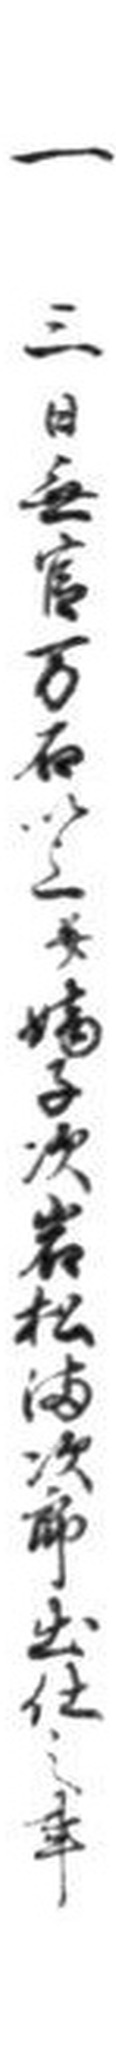一三日無官万石以上并嫡子次岩松満次郎出仕之事
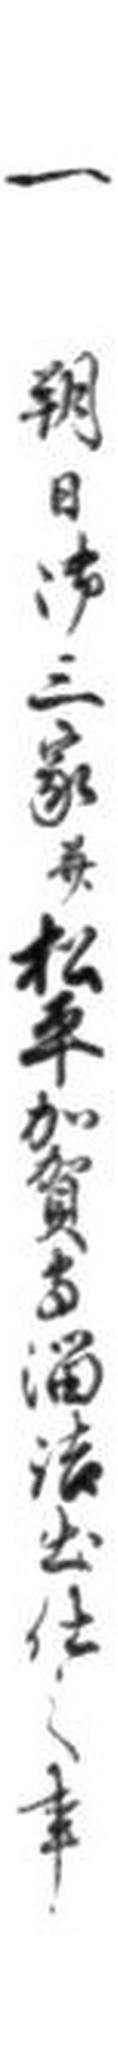一朔日御三家并松平加賀守溜詰出仕之事
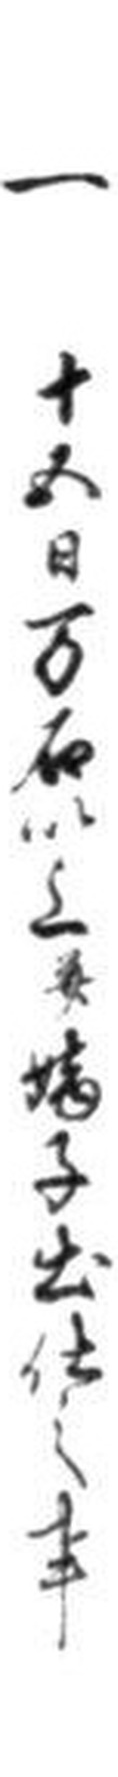一十五日万石以上并嫡子出仕之事
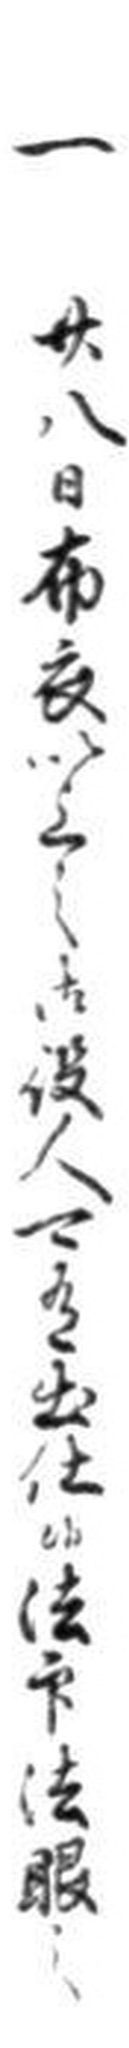一廿八日布衣以上御役人可有出仕候法印法眼之
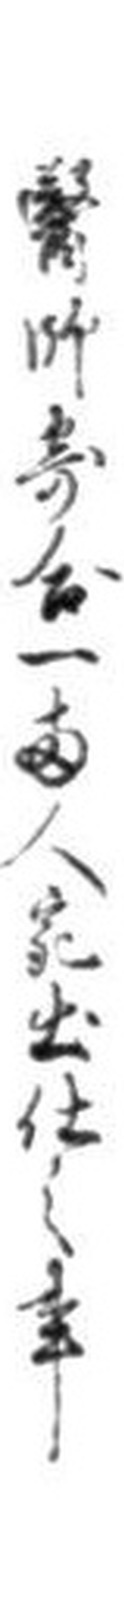医師寄合一両人宛出仕之事
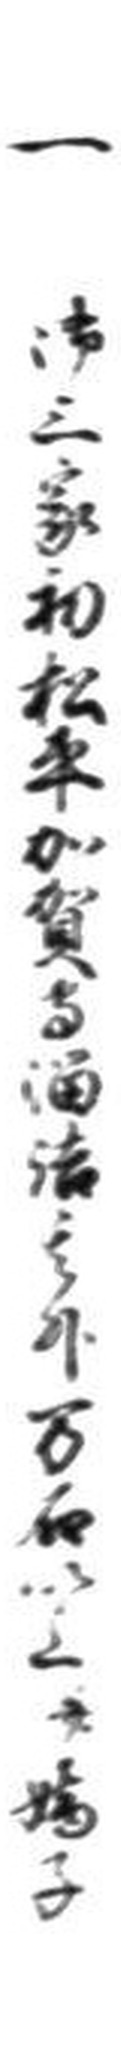一御三家初松平加賀守溜詰其外万石以上并嫡子
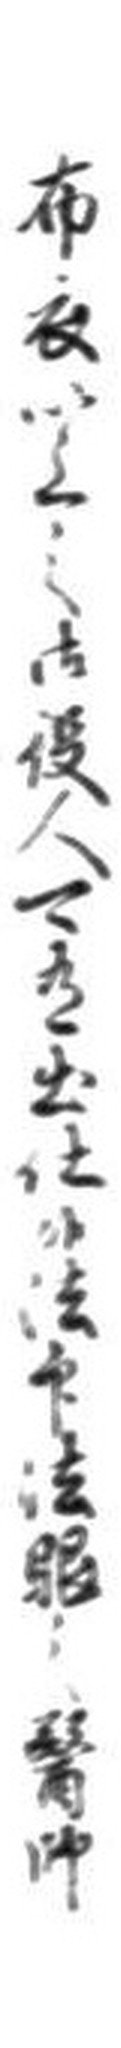布衣以上之御役人可有出仕候法印法眼之医師
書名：家譜 三十八 宗矩公 従享保九年五月到享保九年十二月
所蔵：福井県文書館 Fukui Prefectural Archives
